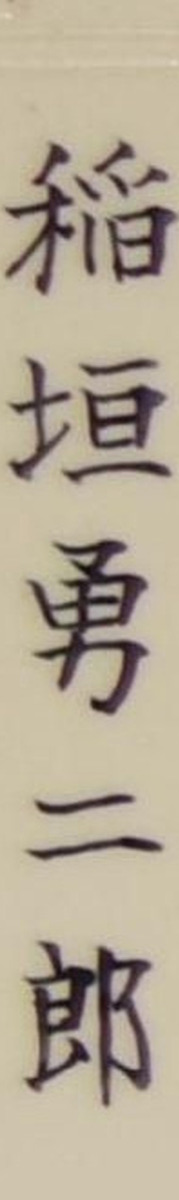稲垣勇二郎

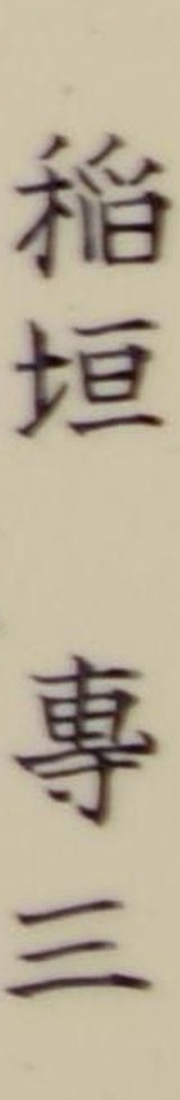稲垣専三
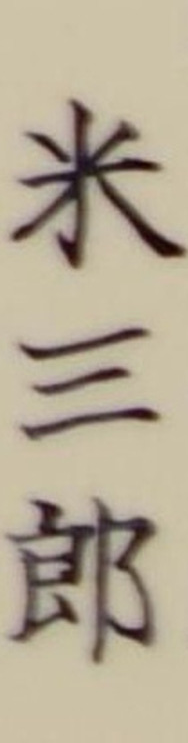米三郎
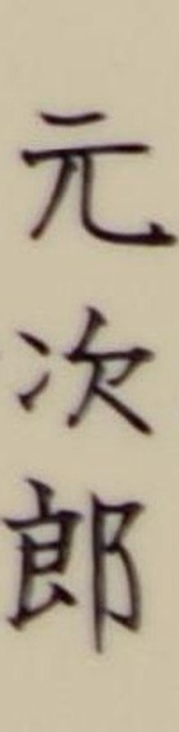元次郎
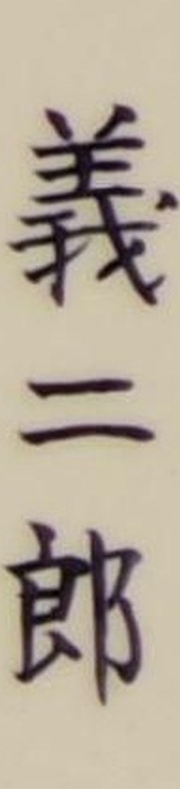義二郎
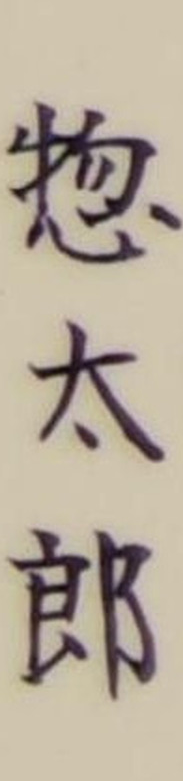惣太郎

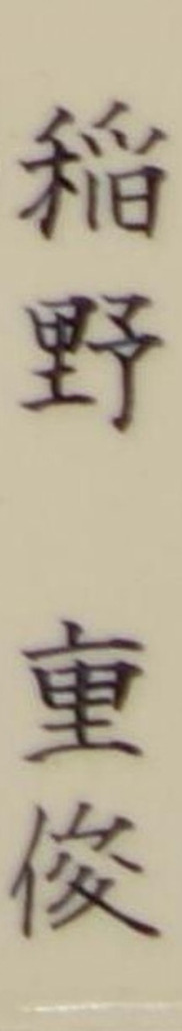稲野重俊
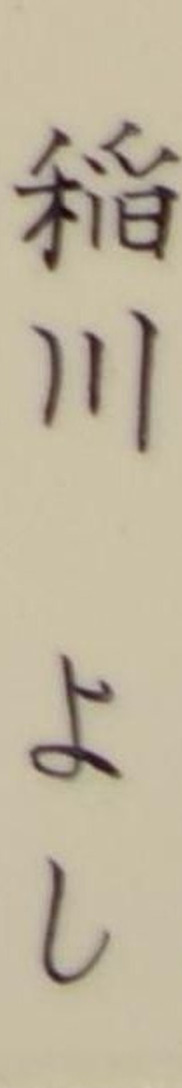稲川よし
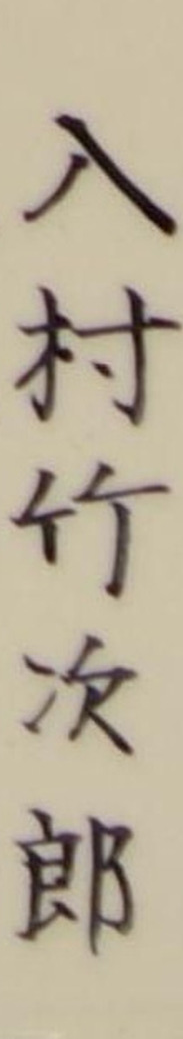入村竹次郎
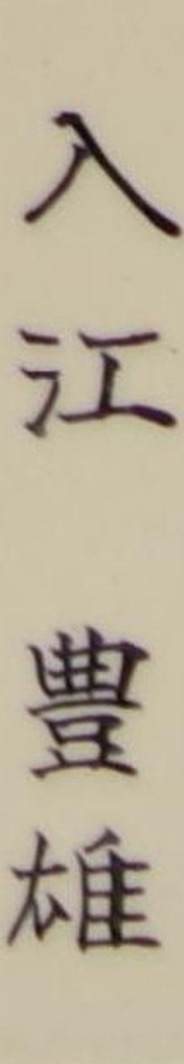入江豊雄
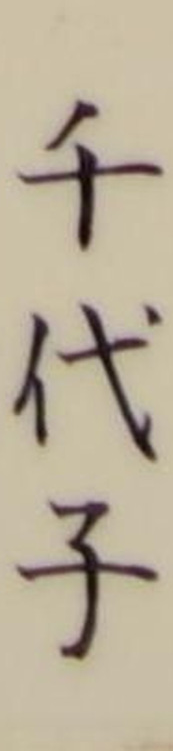千代子
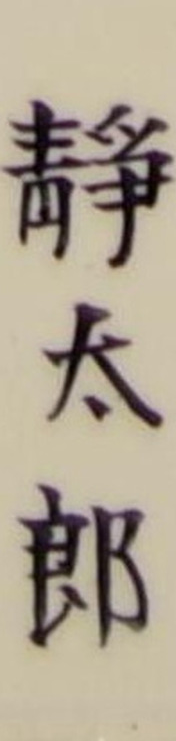静太郎
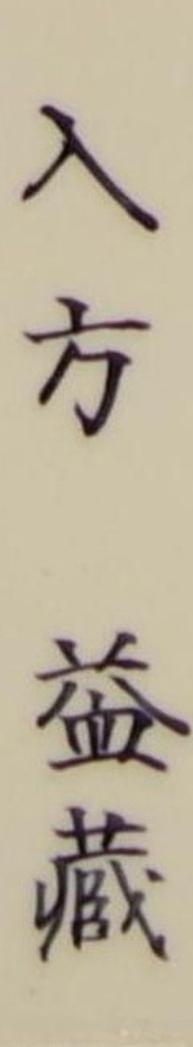入方益蔵

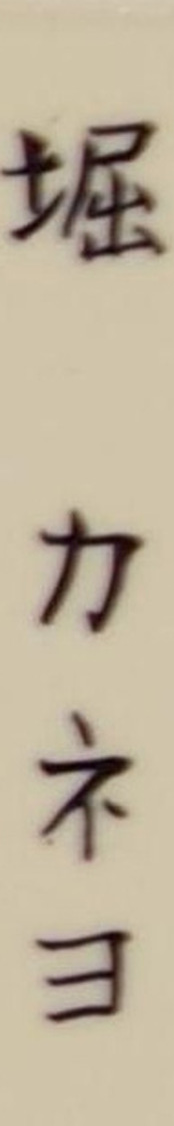堀力ネヨ
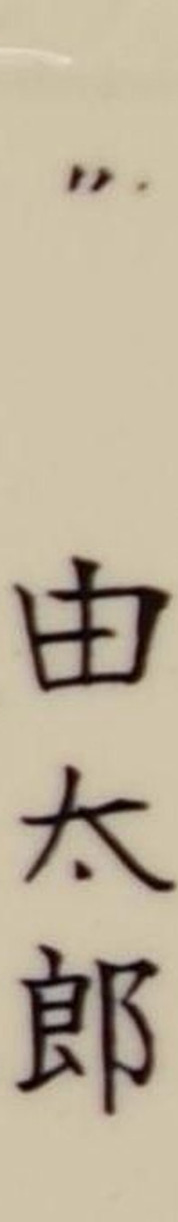由太郎
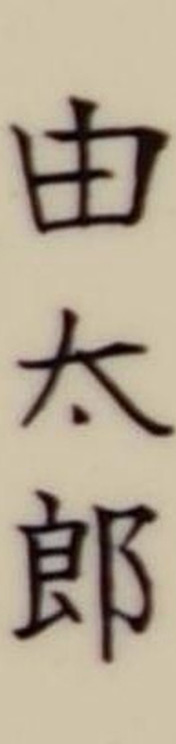由太郎
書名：A~D
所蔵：koyasan kongobuji
